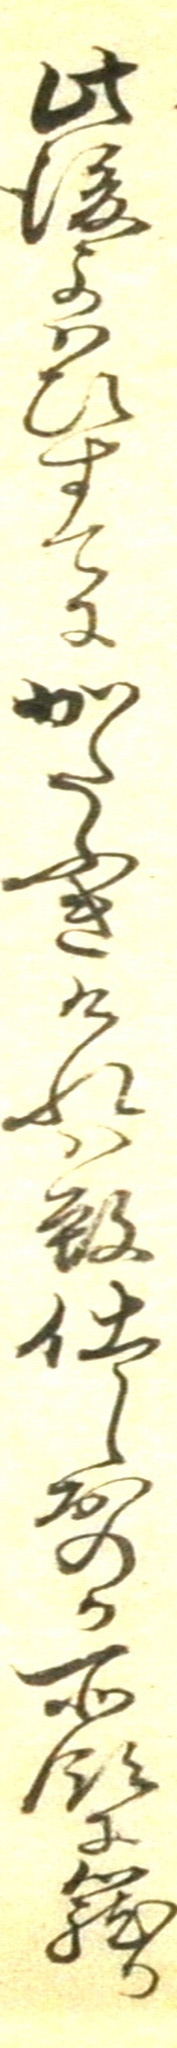此後よはひすてにかたふきけれは致仕しおのか所領に籠り
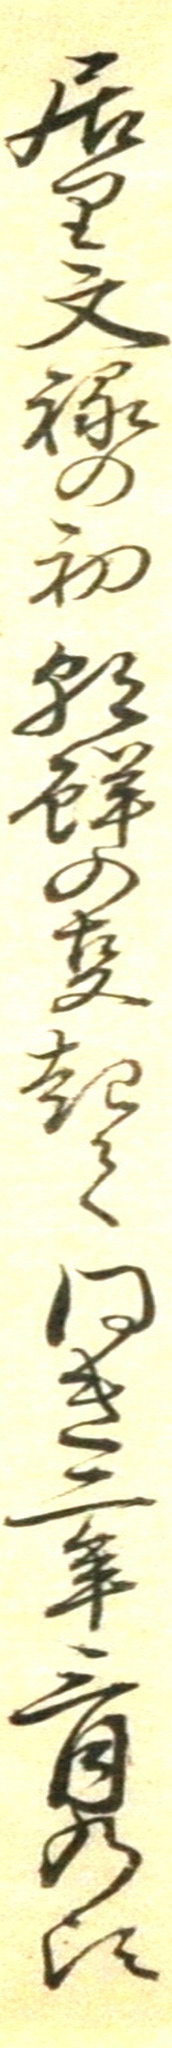居り文禄の初朝鮮の事起て同き二年三月の頃
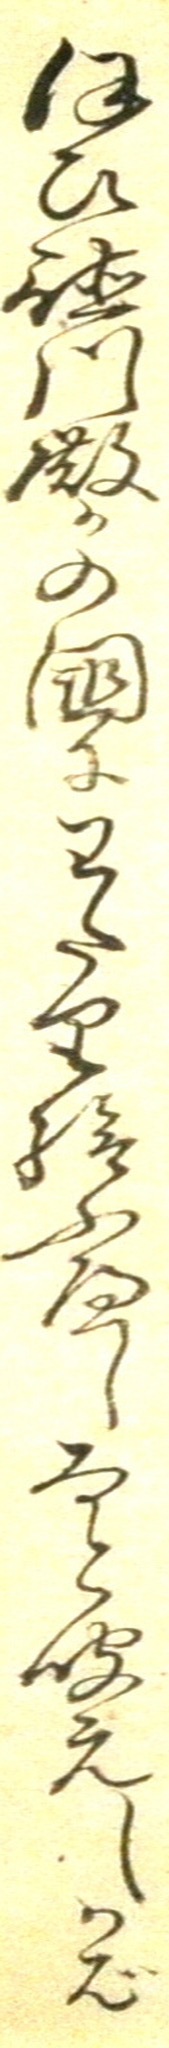ほひ徳川殿かの国にわたり給ふへしなと聞えしかば
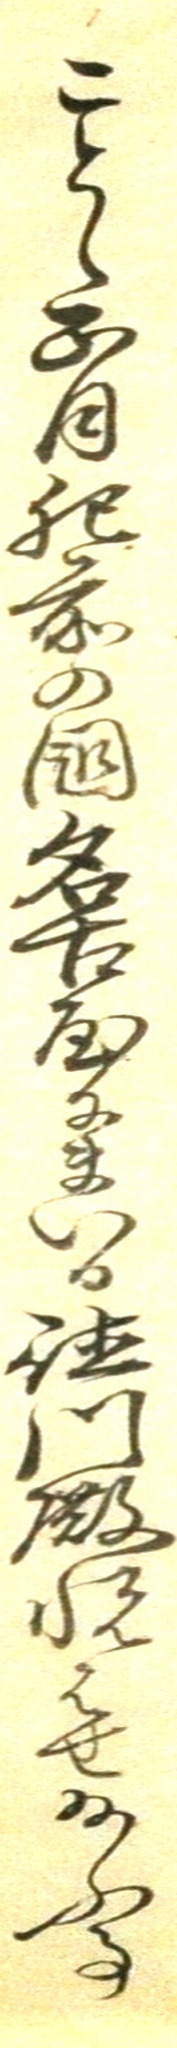ことし正月肥前の国名古屋にまいる徳川殿悦はせ給ふ事
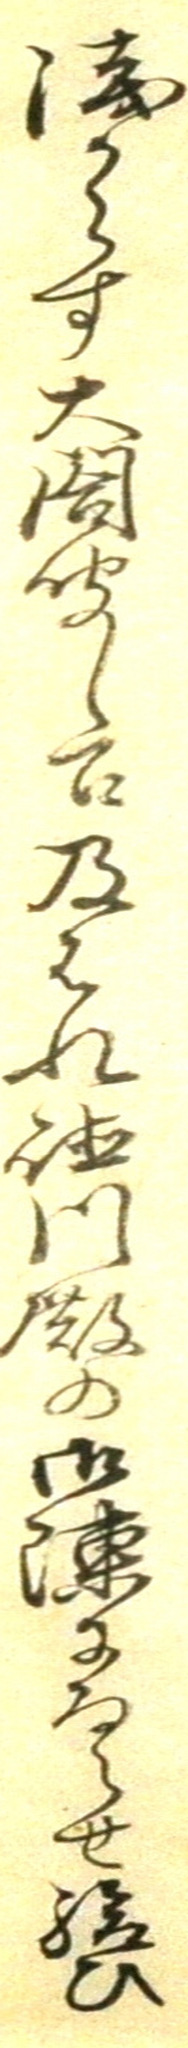浅からす太閤聞し召及はれ徳川殿の御陣にならせ給ひ
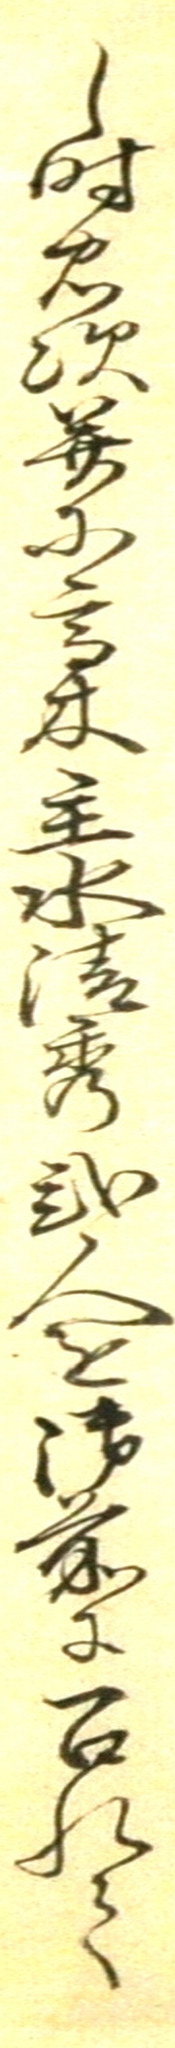し時忠次幷に高木主水清秀弐人を御前に召れて
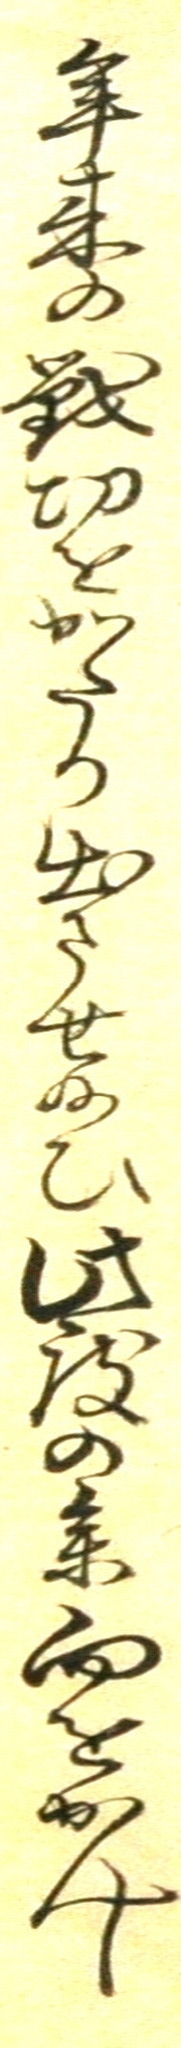年来の戦功をかたり出させ給ひ此度の参向をかんし

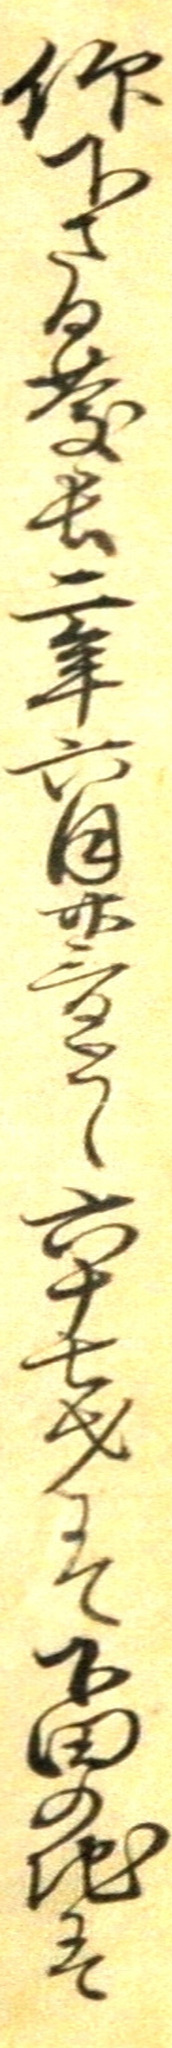仰下さる慶長二年六月廿三日とし六十七才にて下田の地にて
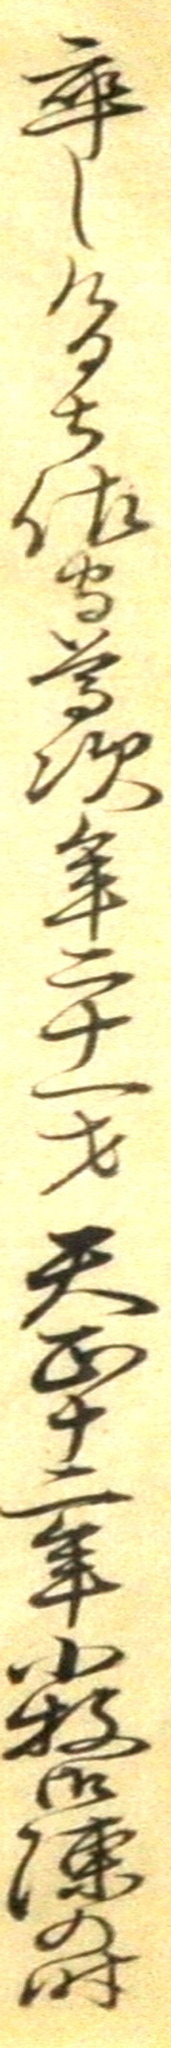卒しける土佐守尊次年二十一才天正十二年小牧御陣の時
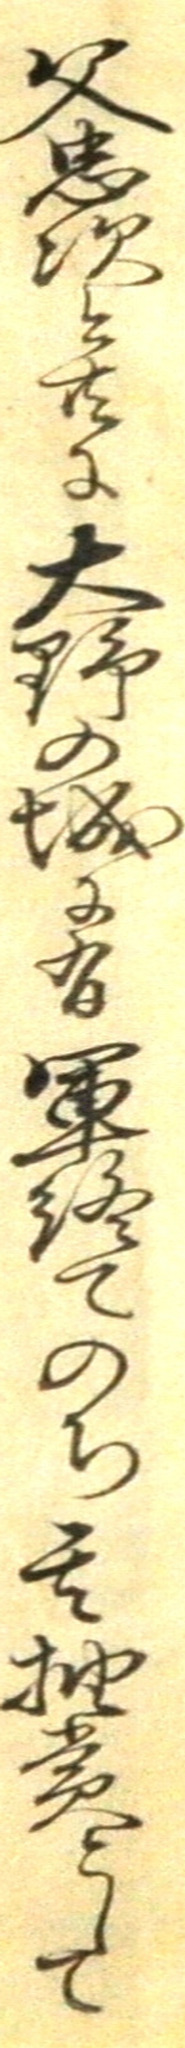父忠次と共に大野の城に有軍終てのち其抽賞として
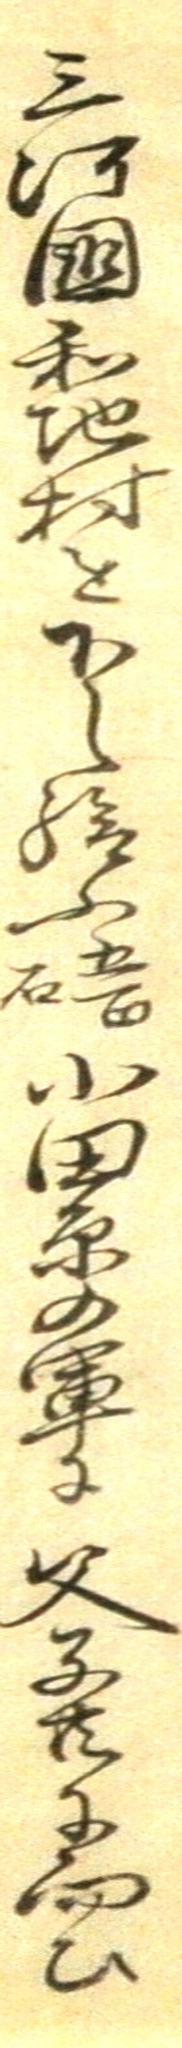三河国和地村を下し給ふ五百石小田原の軍に父子共に向ひ
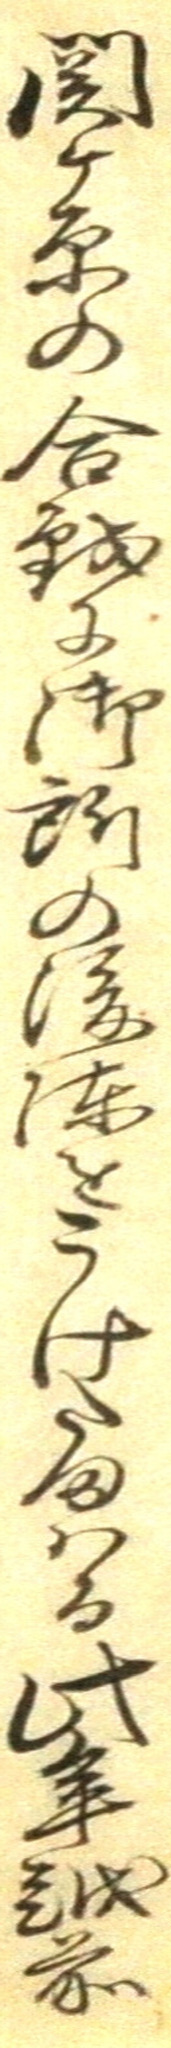関ヶ原の合戦に御所の後陣をうけたまはる此年越前
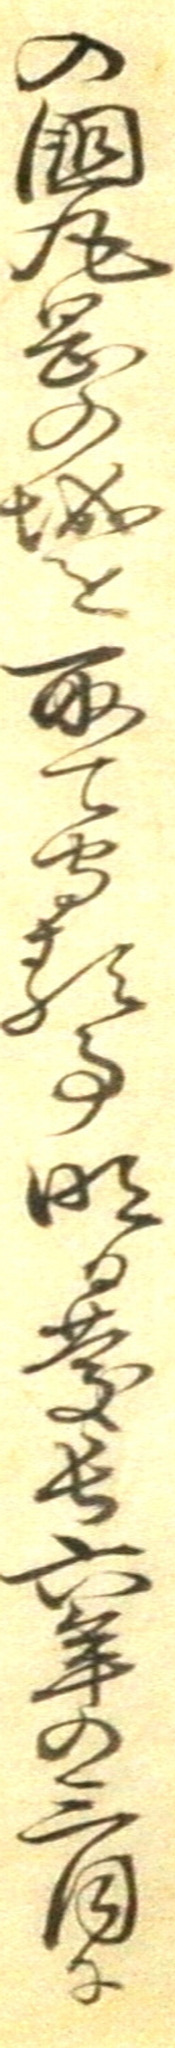の国丸岡の城を取て守る事明る慶長六年の三月に
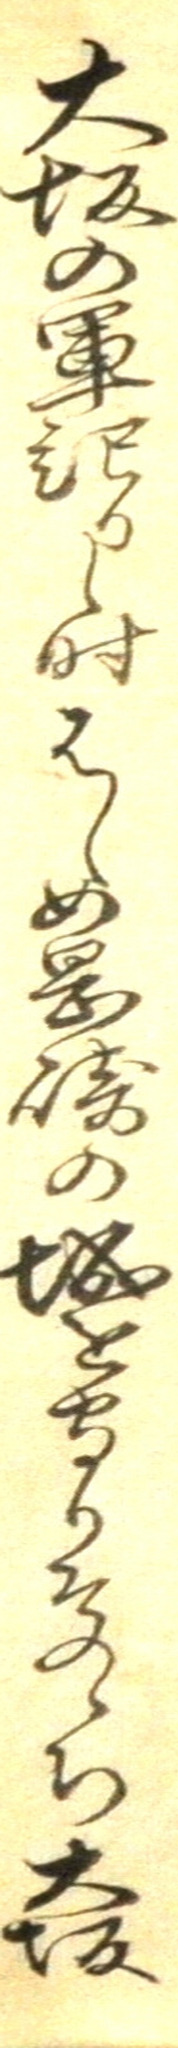大坂の軍起りし時はしめ岡崎の城を守りそのゝち大坂
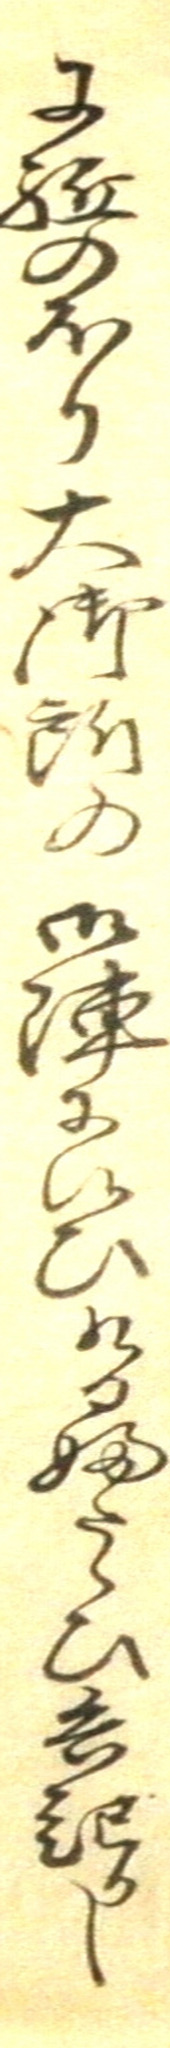に駈のほり大御所の御陣に候ひけるふたゝひ兵起りし
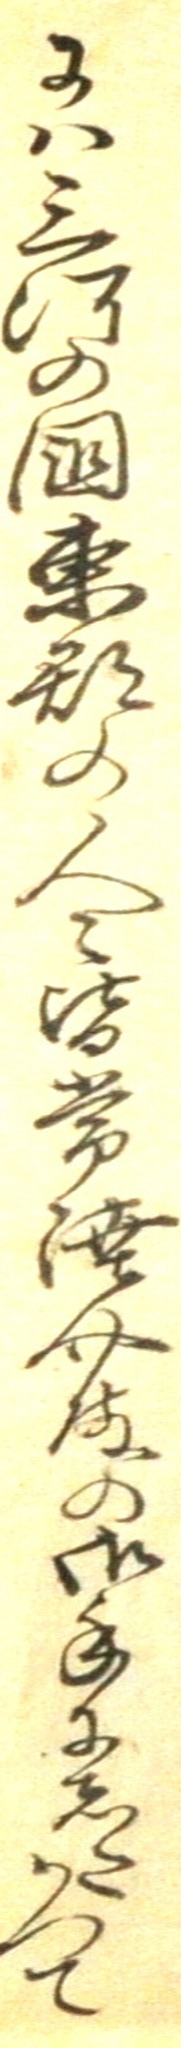には三河の国東郡の人々皆常陸介殿の御手にしたかつて
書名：藩翰譜（四・下）
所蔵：伊那市立高遠町図書館・合同会社AMANE
